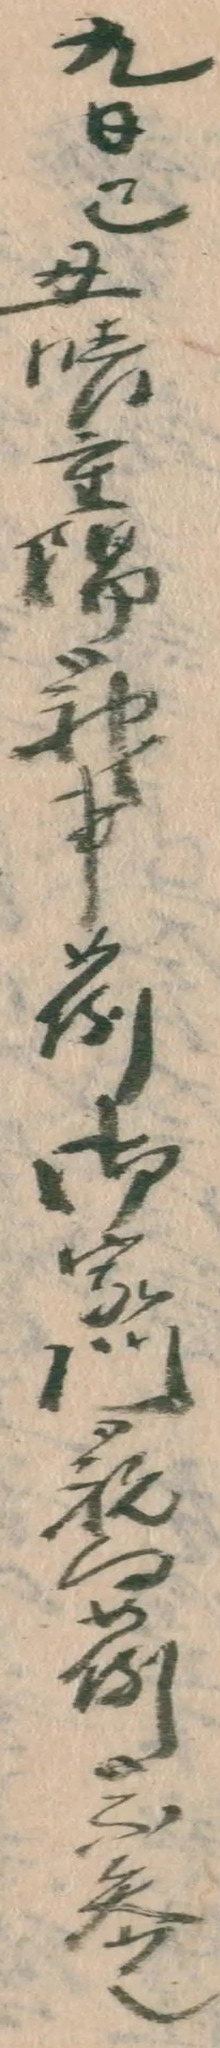九日己丑晴重陽御神之如例御家門御祝向如例御不参之
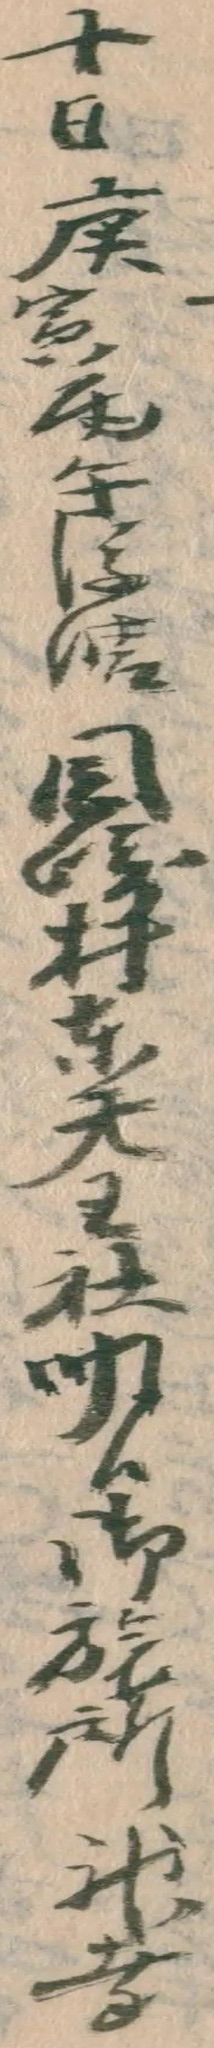十日庚寅雨午後晴岡崎村東天王社明日御旅所神輿
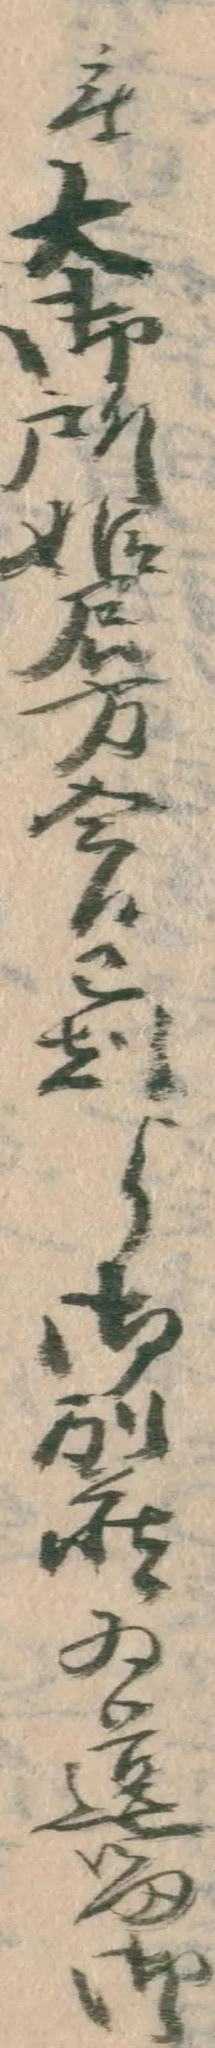ニ付大御所姫君方今日巳刻より御別荘ニ為逗留御
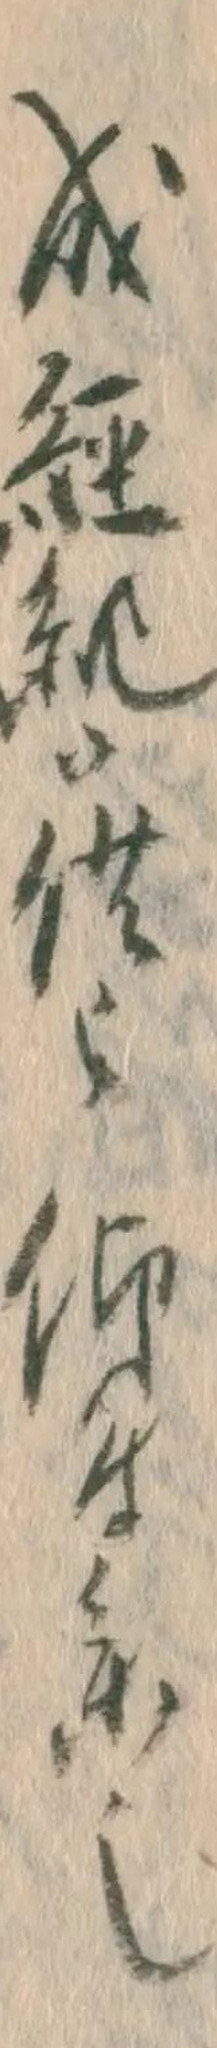成経紀御供被仰付参之
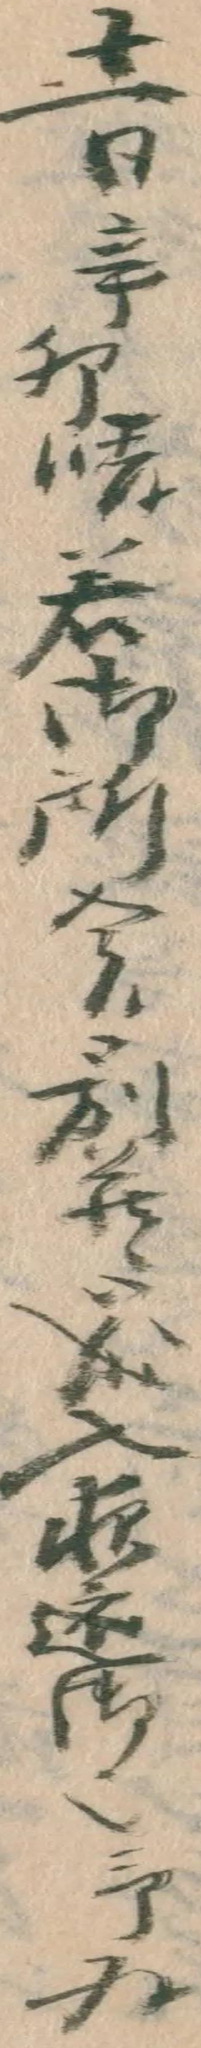十一日辛卯晴若御所今日別荘へ御成入夜還御也予為
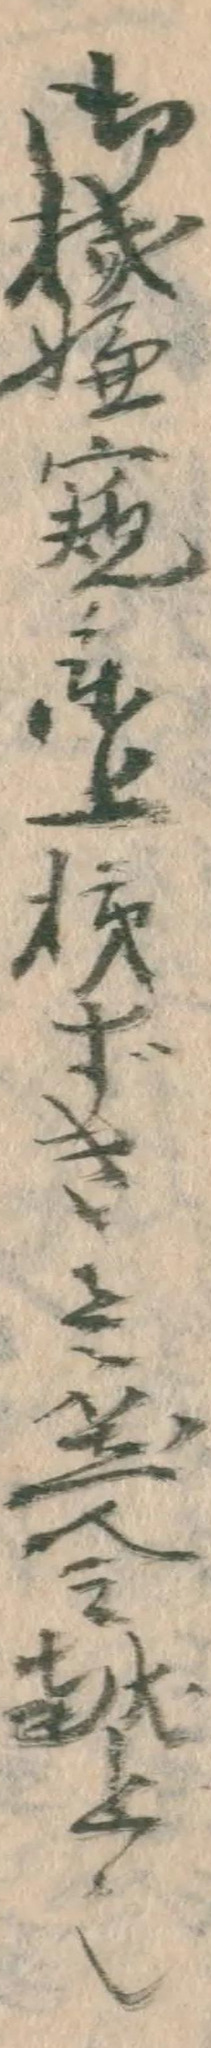御機嫌窺ニ参上柿ずき壱器令献上也
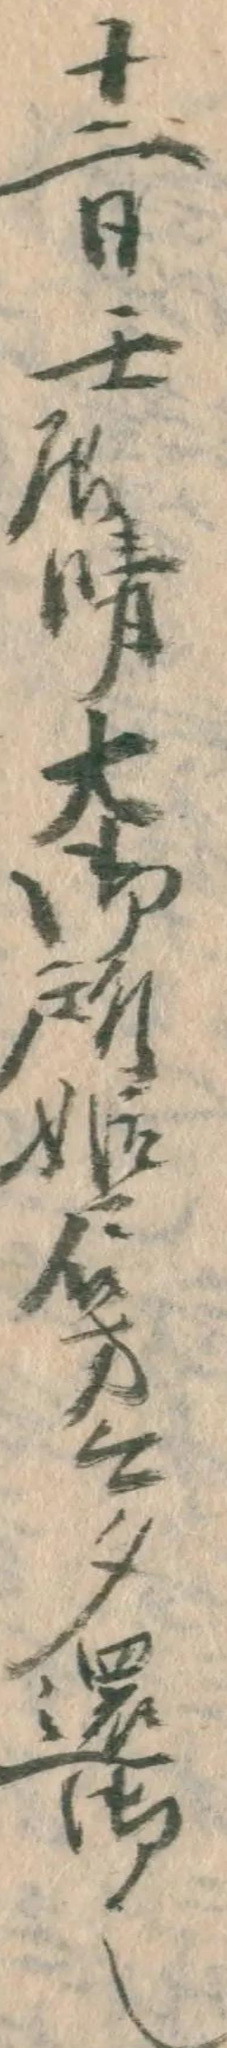十二日壬辰晴大御所姫君方今夕還御也
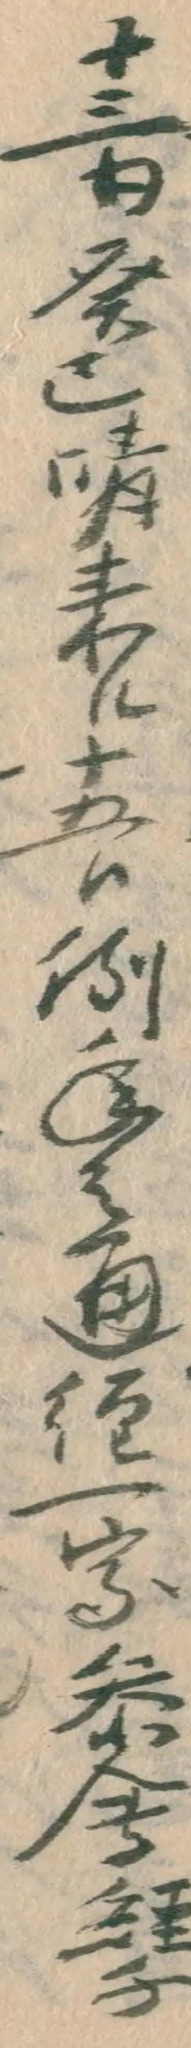十三日癸巳晴来ル十五日例年之通経一家参會経子
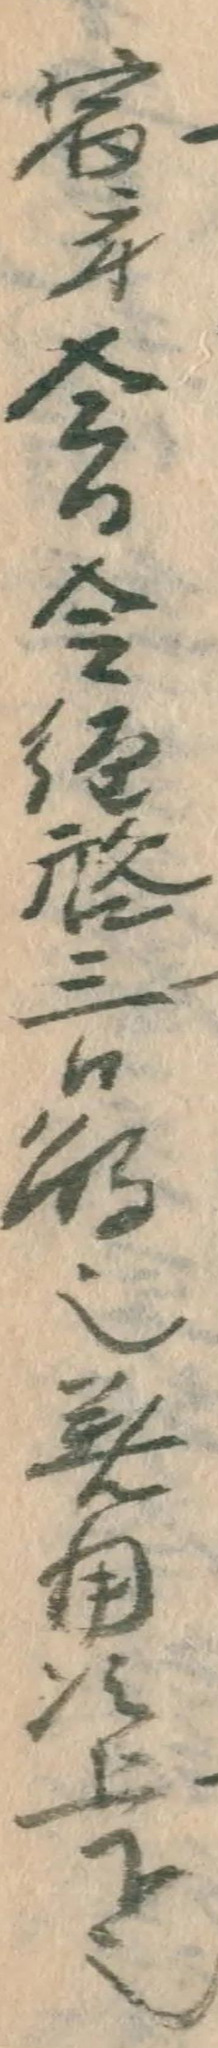宿ニ付今日令経啓三日觸也着用次上下也

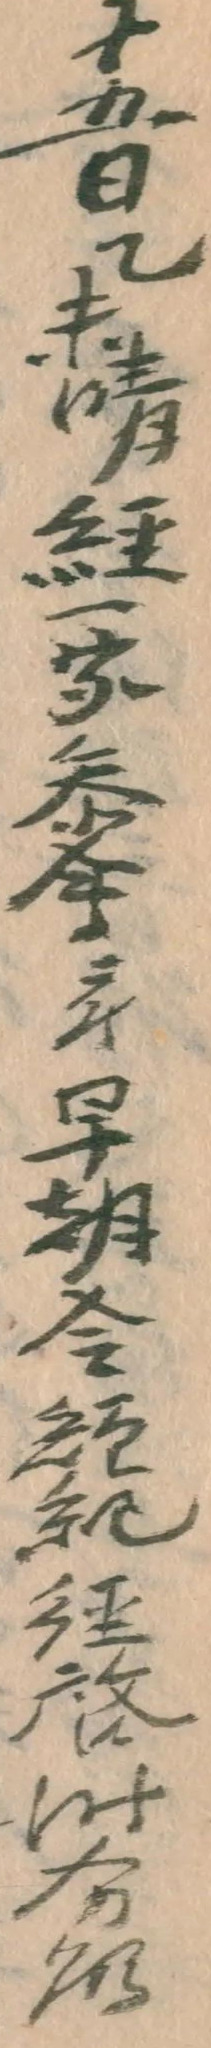十五日乙未晴経一家参會ニ付早朝令経紀経啓時分觸
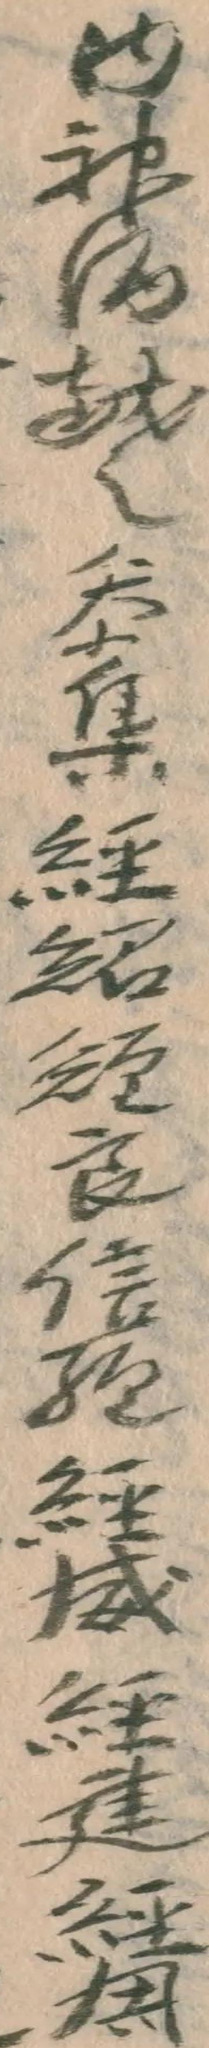内神酒献之参集経紹経良信経経威経建経周
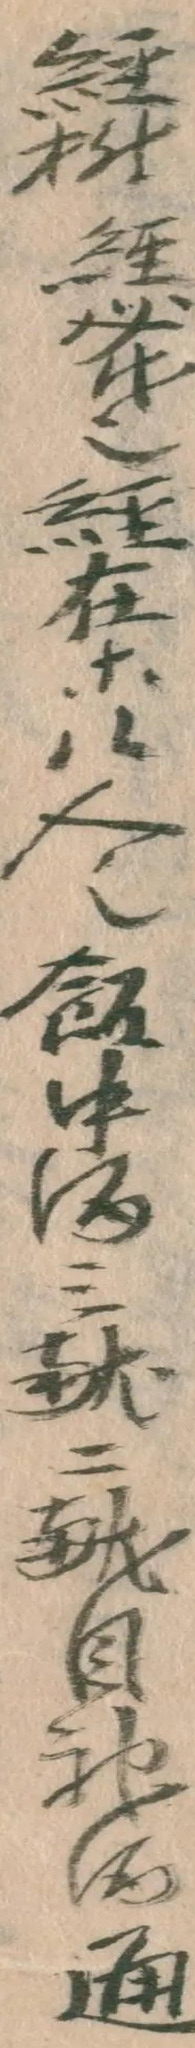経樹経必代也経在等八人也飯中酒三献二献自神酒通
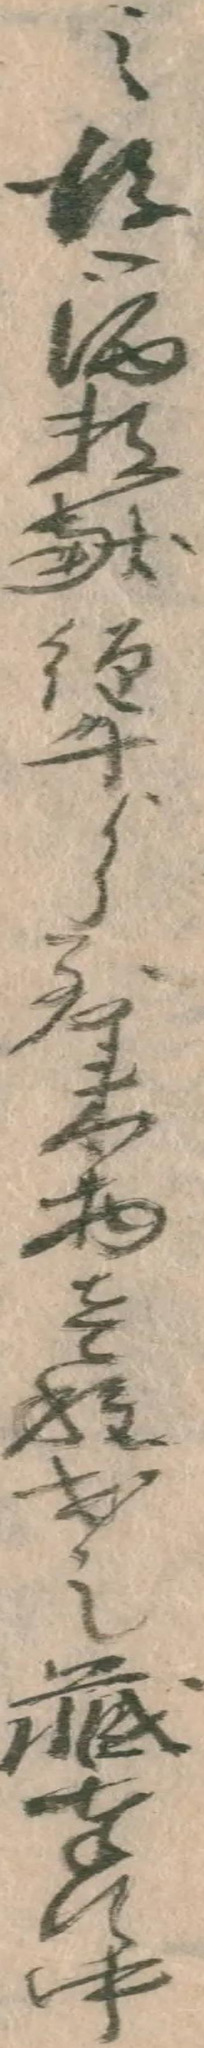之後御酒数献経千より別来物壱枚出也蔵奉行中
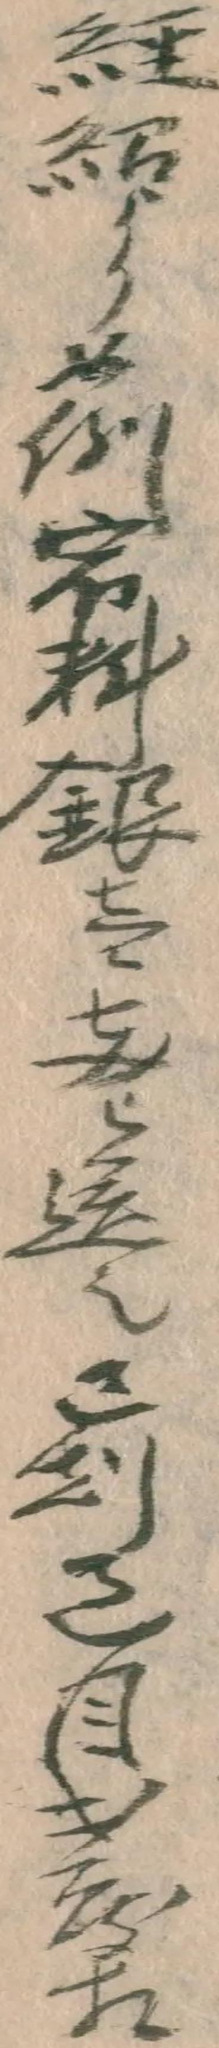経紹より如例宿料銀壱匁被送也巳刻過目出度相
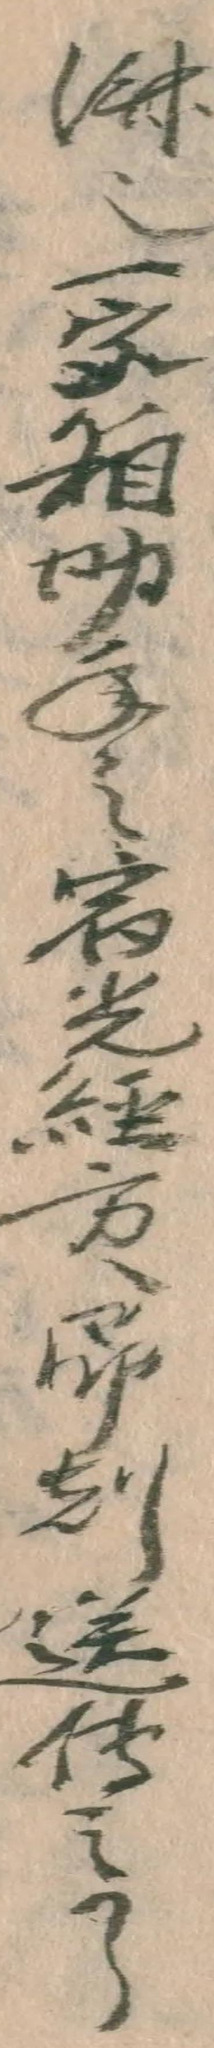済也一家箱昨年之宿光経方へ即刻送傳之了
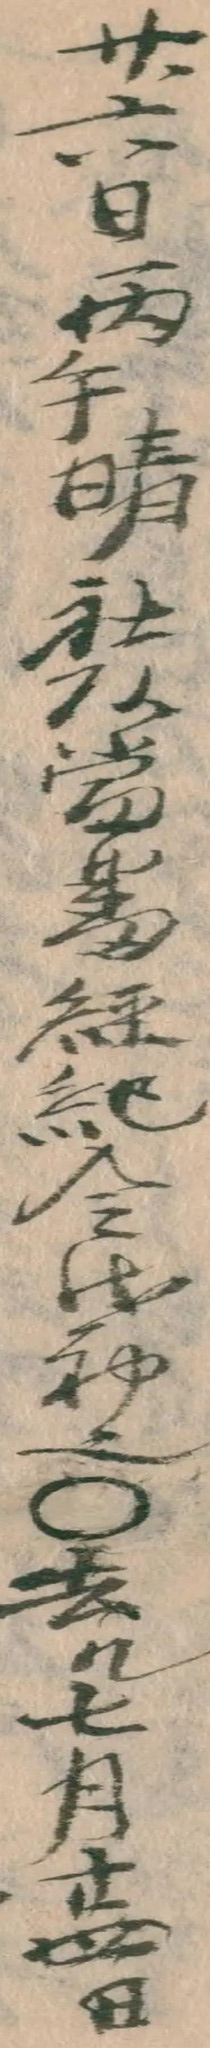廿六日丙午晴社頭當番経紀令氏勤也○去ル七月廿四日
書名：賀茂社記録. 第67冊
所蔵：国立国会図書館 National Diet Library, JAPAN
